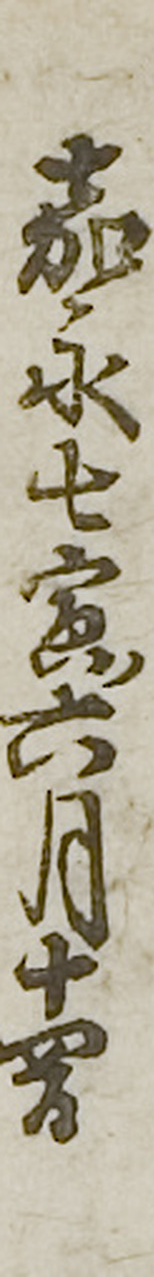嘉永七寅六月十四日
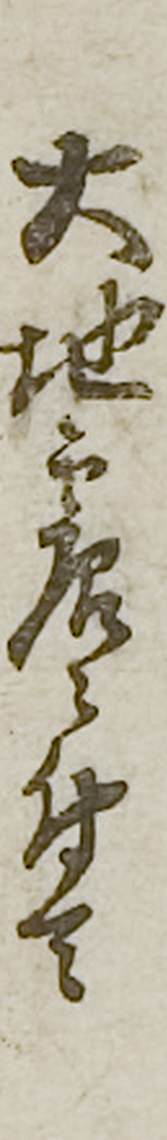大地震二付て
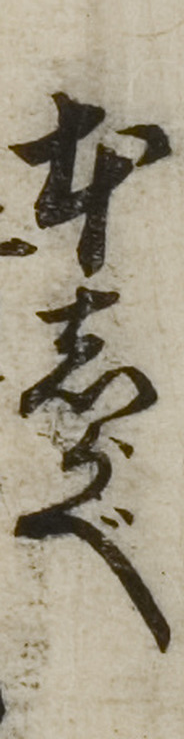本しらべ
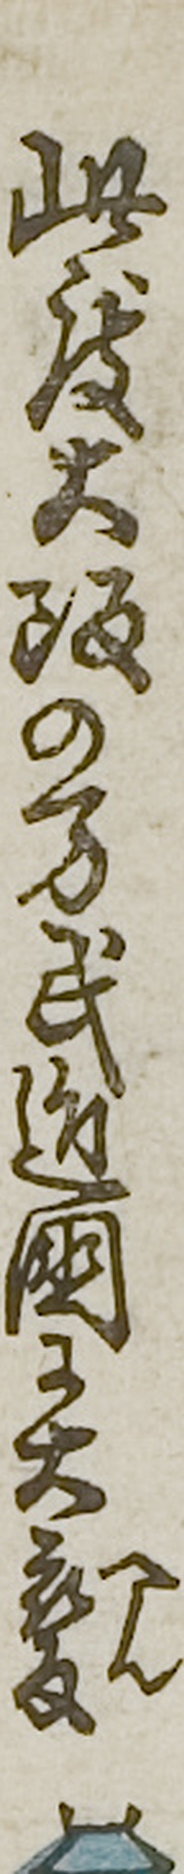此度大阪の万民近国に大変
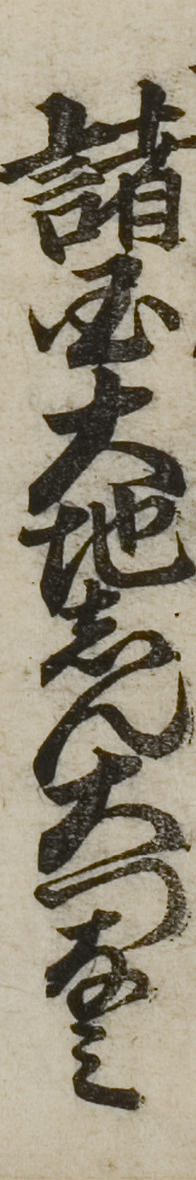諸国大地しん大つなみ
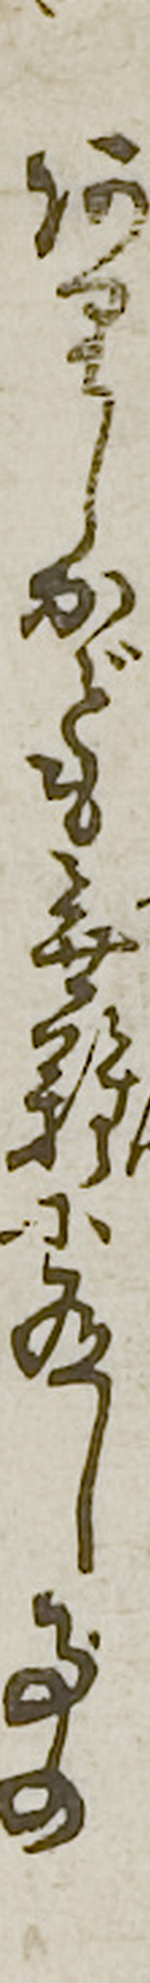ありしかども無難に有し事の
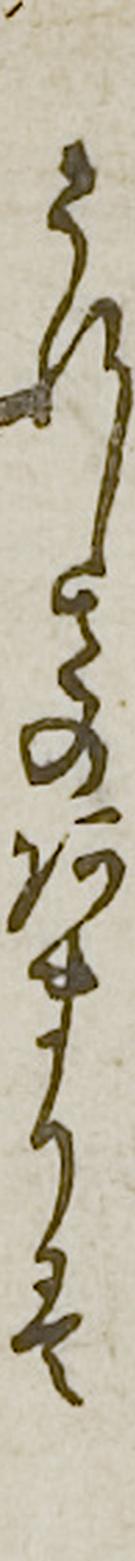うれしさのあまりにて
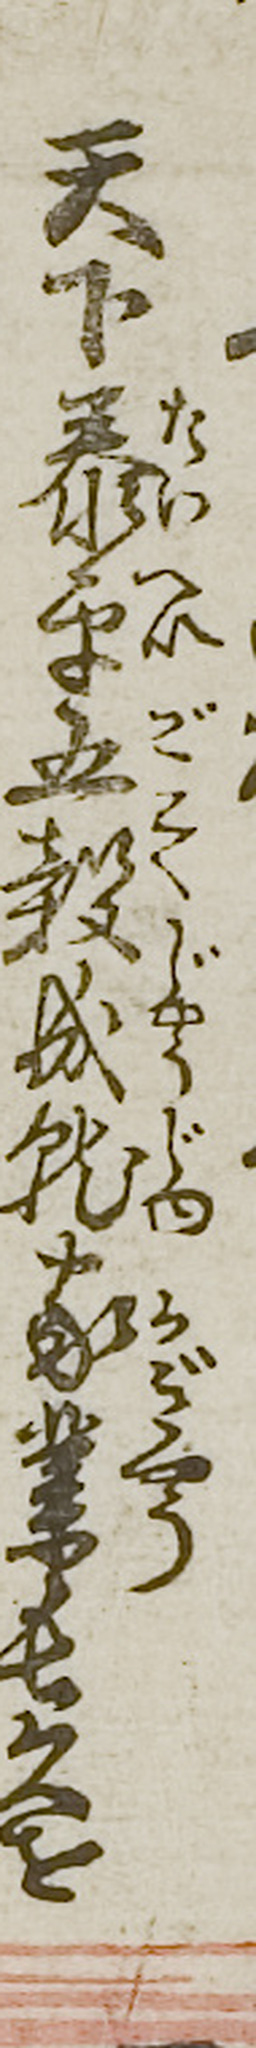天下泰平五穀成就家業長久を
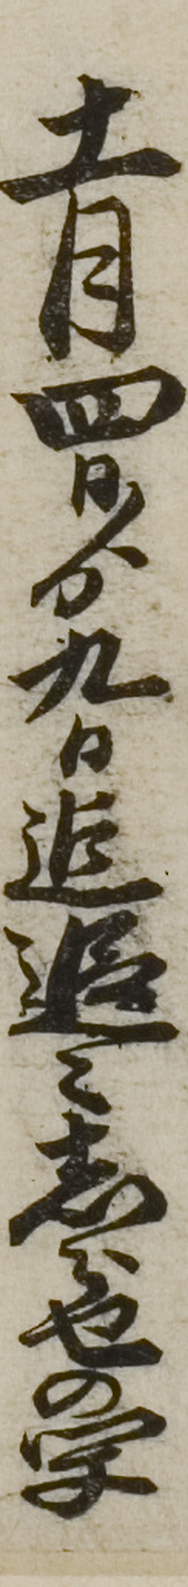十一月四日より九日迄追々しらせの写
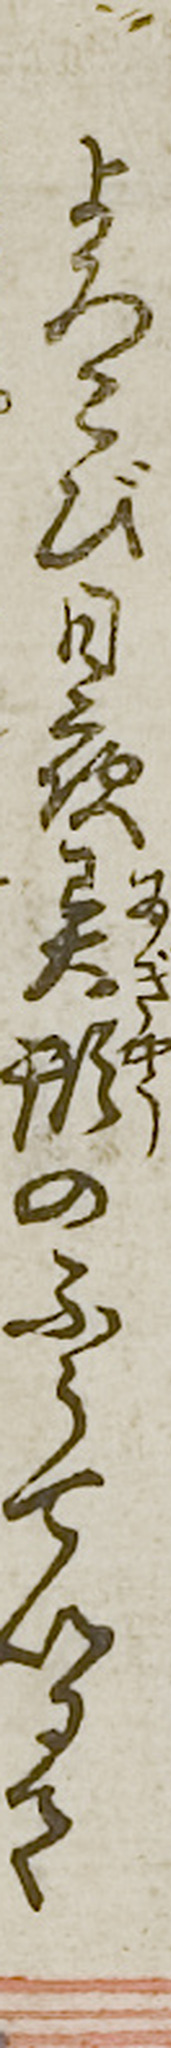よろこび日夜異形のふうていにて
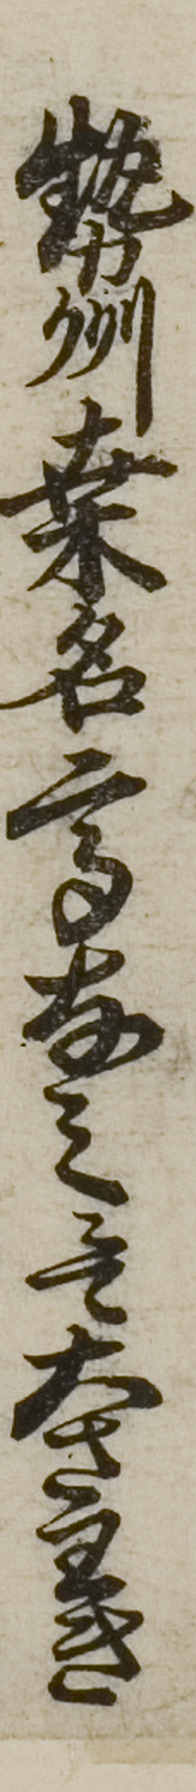勢州桑名高なみにて大さわき
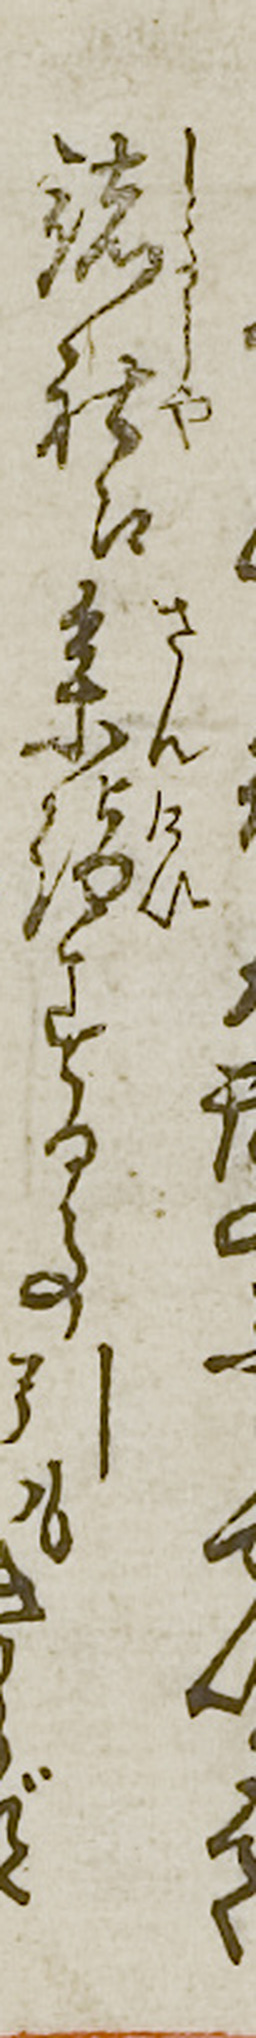諸社え参詣する事引もきらず
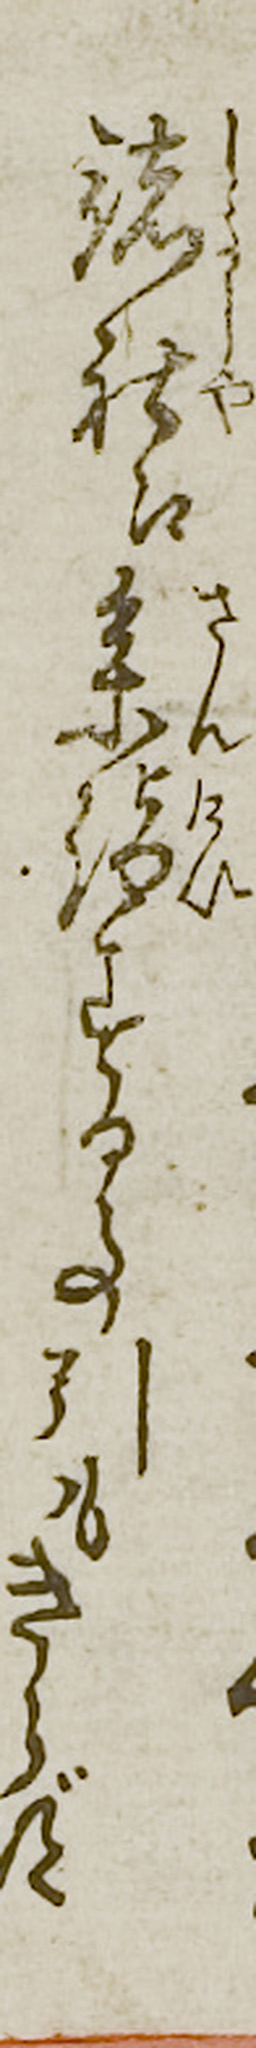諸社え参詣する事引もきらず
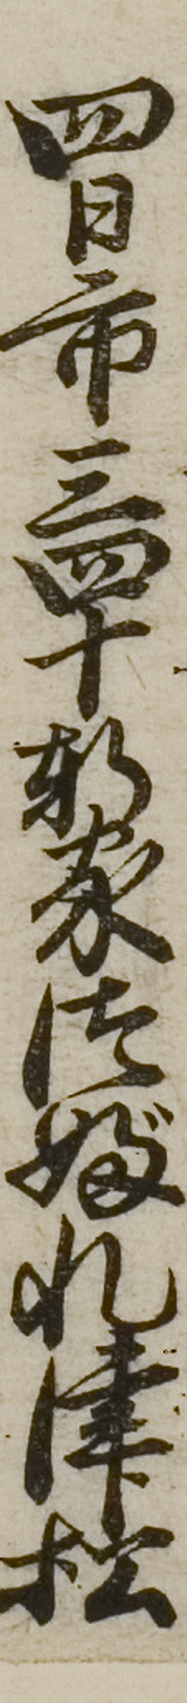四日市三四十軒家つぶれ津松
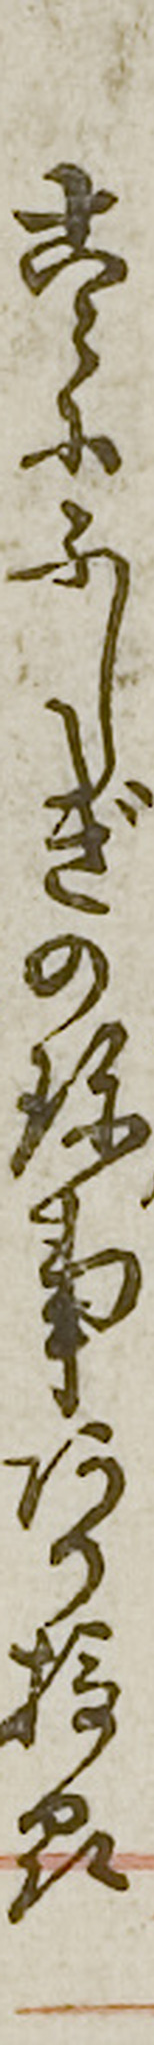こゝにふしぎの珍事あり摂州
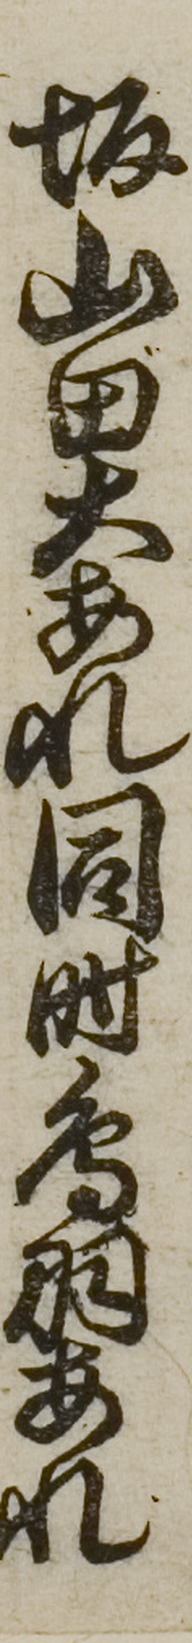坂山田大あれ同時鳥羽あれ
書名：本しらべ諸国大地しん大つなミ
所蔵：東京大学総合図書館 General Library in the University of Tokyo, JAPAN
